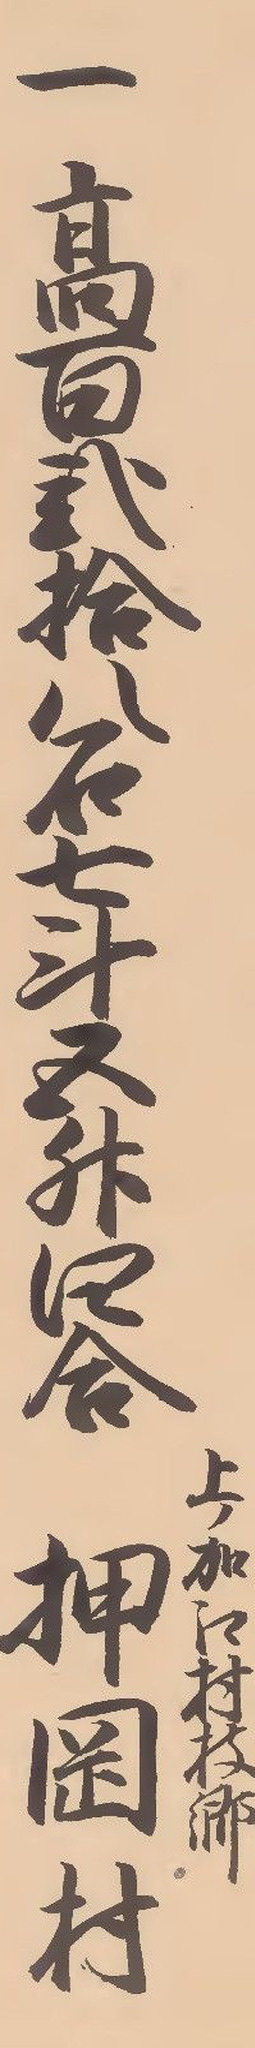一髙百弐拾八石七斗五升四合押岡村
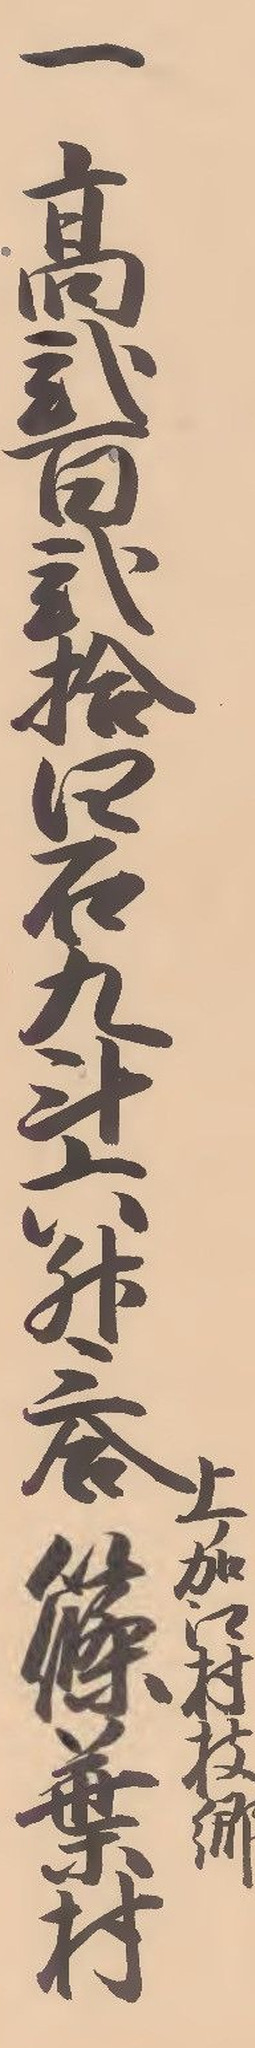一髙弐百弐拾四石九斗六升三合篠葉村

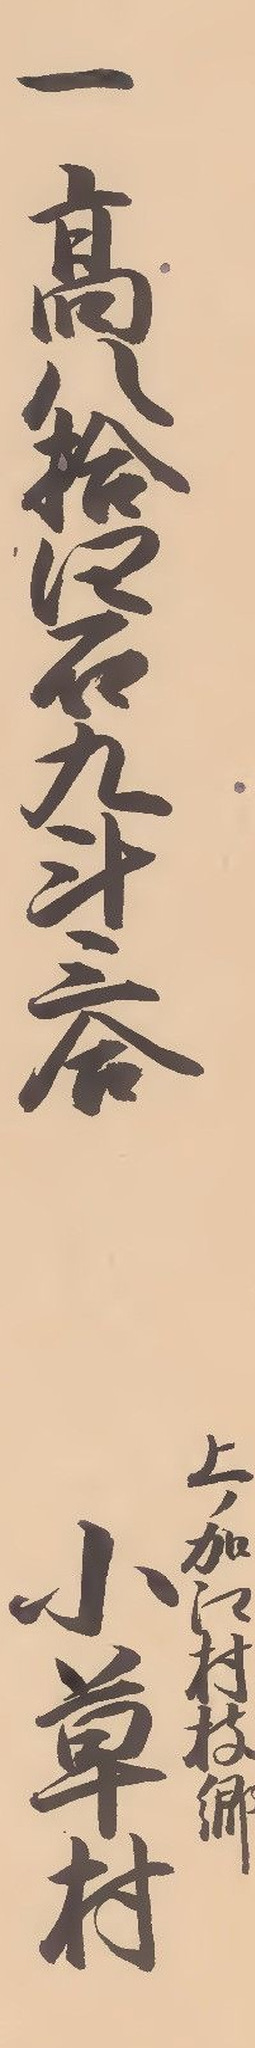一髙八拾四石九斗三合小草村
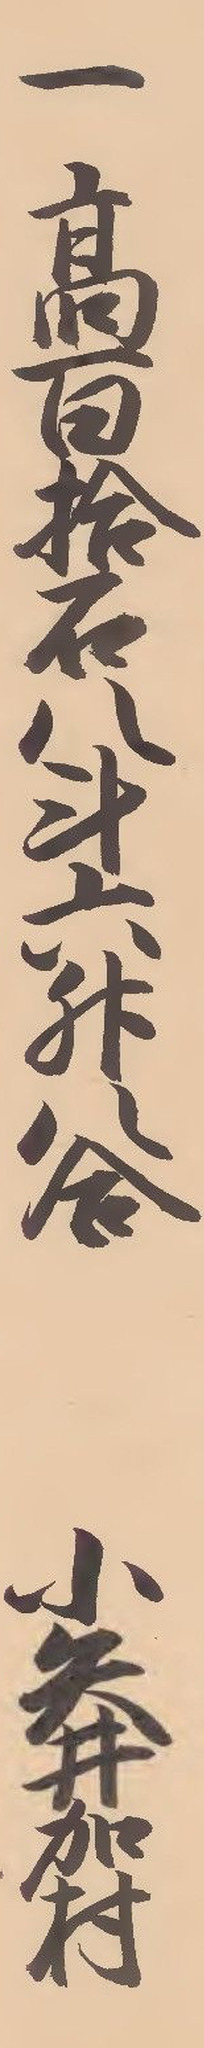一髙百拾石八斗六升八合小矢井加村
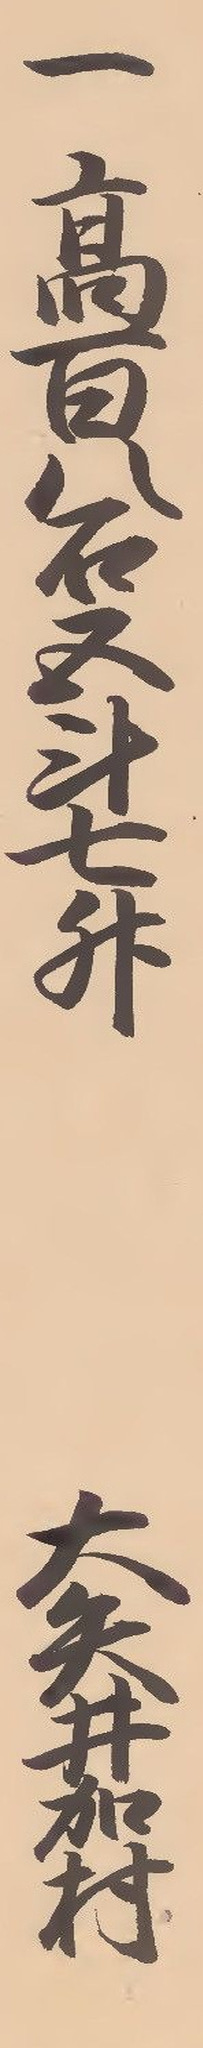一髙百八石五斗七升大矢井加村
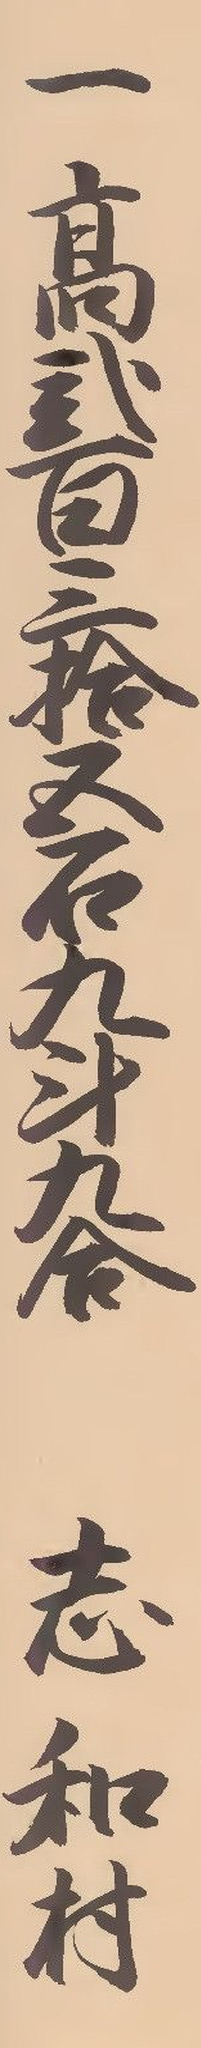一髙弐百三拾五石九斗九合志和村
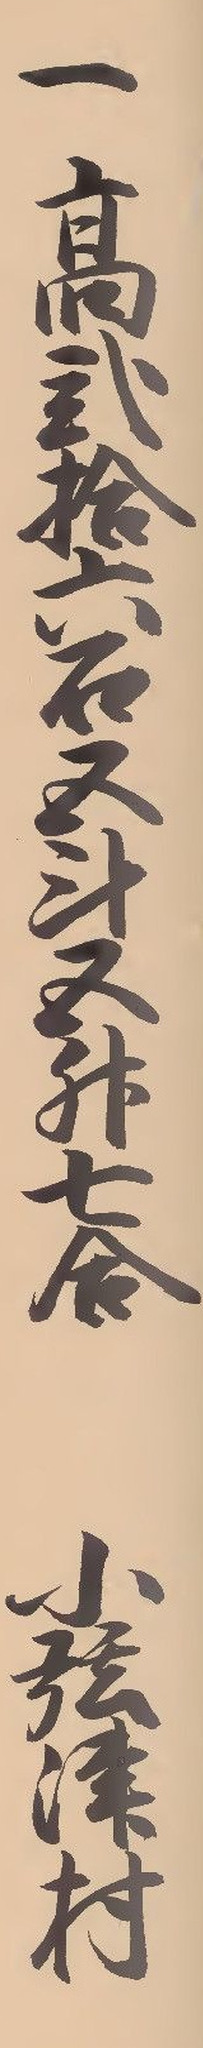一髙弐拾六石五斗五升七合小弦津村
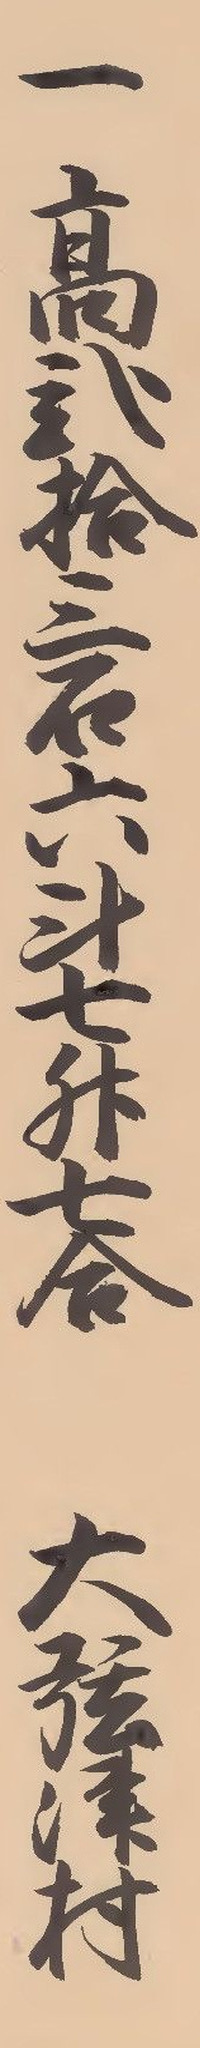一髙弐拾三石六斗七升七合大弦津村
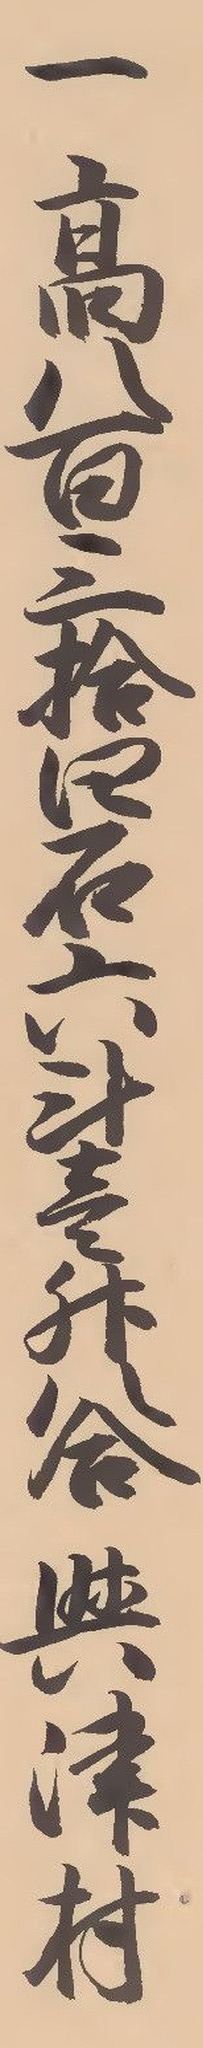一髙八百三拾四石六斗壱升八合興津村
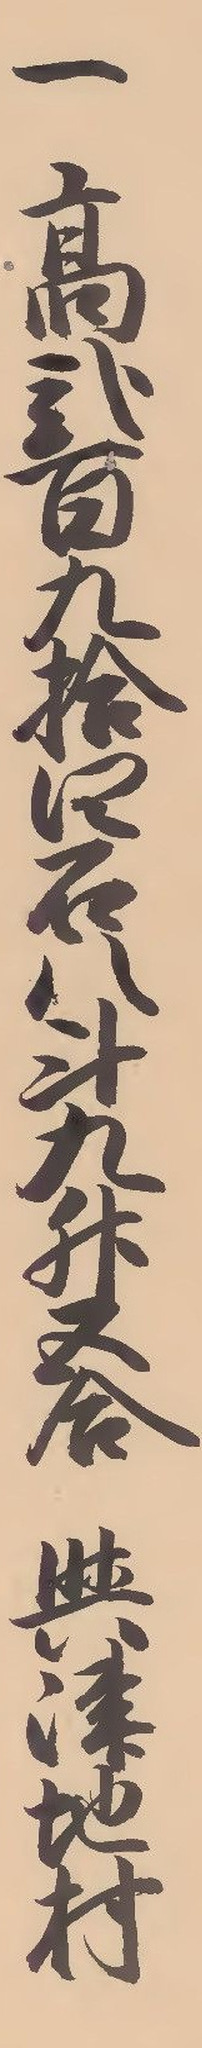一髙弐百九拾四石八斗九升五合興津地村

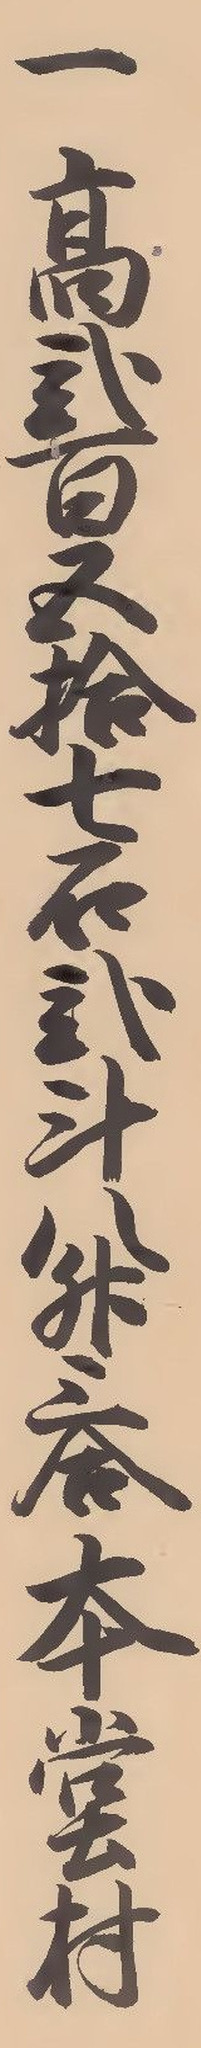一髙弐百五拾七石弐斗八升三合本堂村
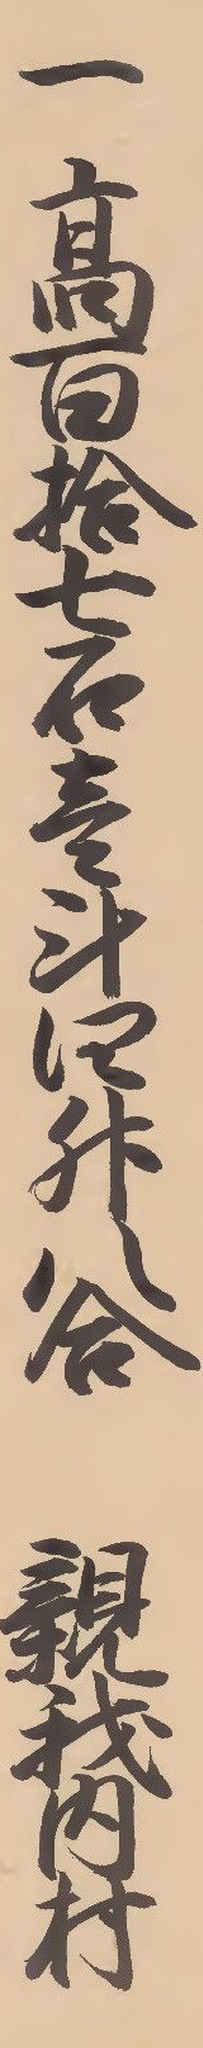一髙百拾七石壱斗四升八合親我内村
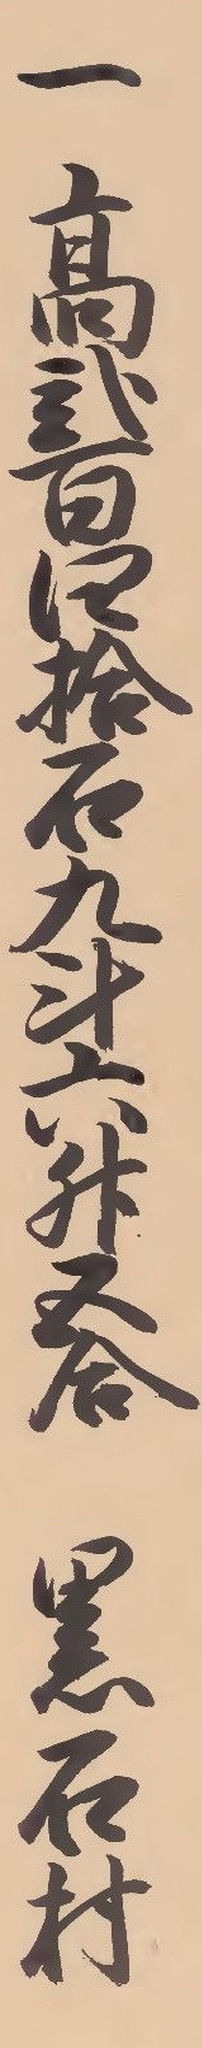一髙弐百四拾石九斗六升五合黑石村
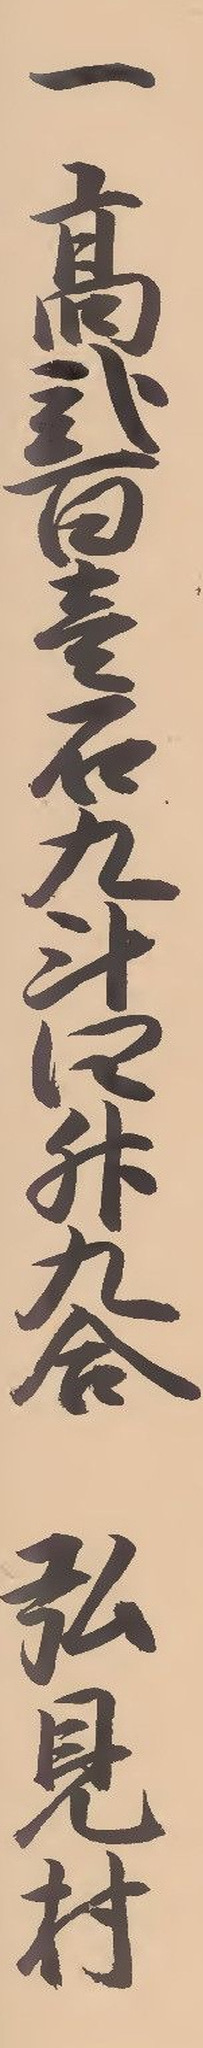一髙弐百壱石九斗四升九合弘見村
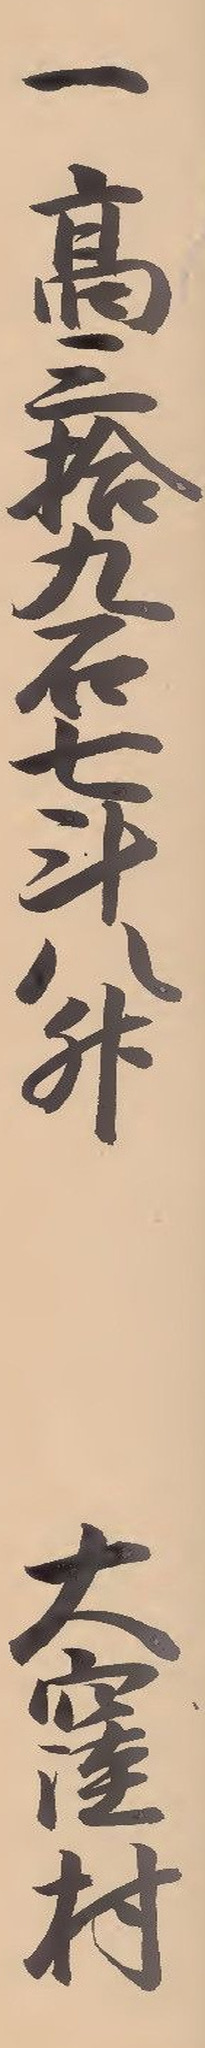一髙三拾九石七斗八升大窪村
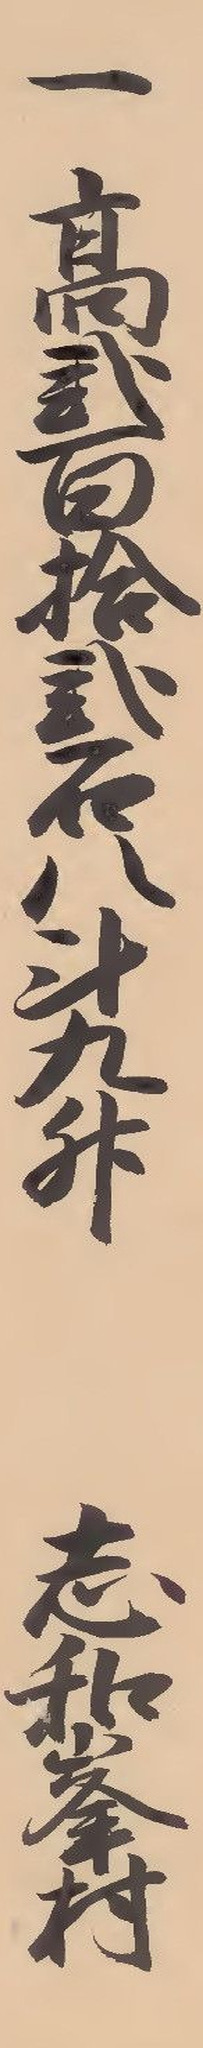一髙弐百拾弐石八斗九升志和峯村
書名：土佐国郷帳
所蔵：国立公文書館 National Archives of Japan
